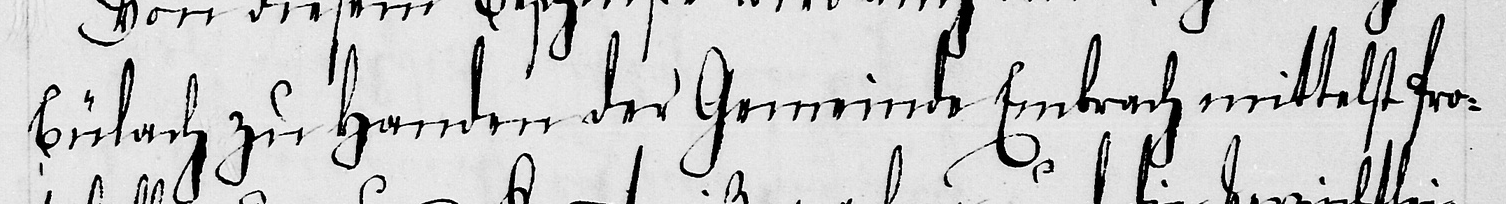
Bülach zu Handen der Gemeinde Embrach mittelst Pr¬
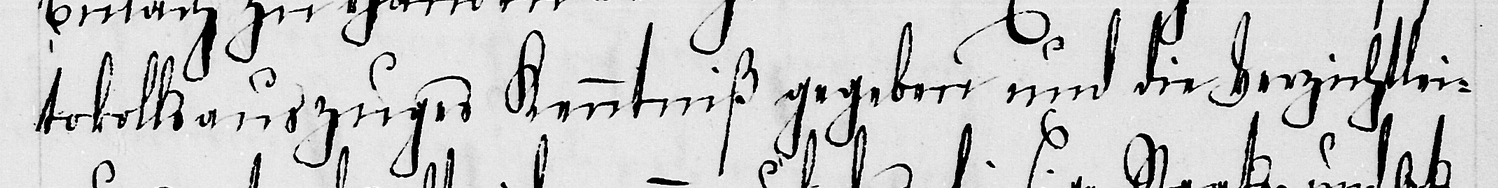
otokollsauszuges Kenntniß gegeben und die Verzichtlei¬
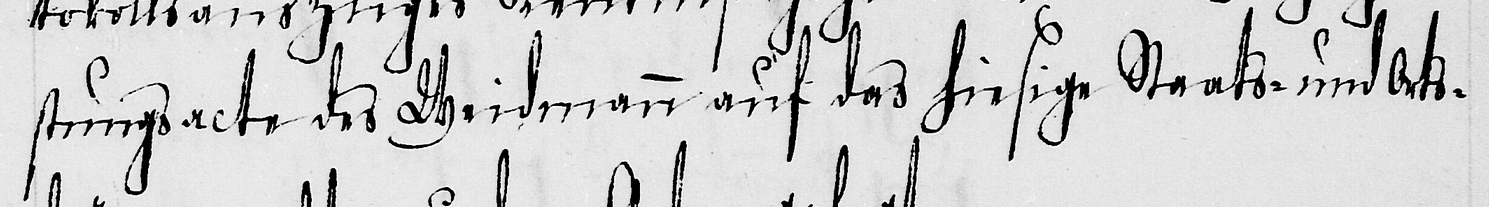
stungsacte des Weidmann auf das hiesige Staats- und Orts¬
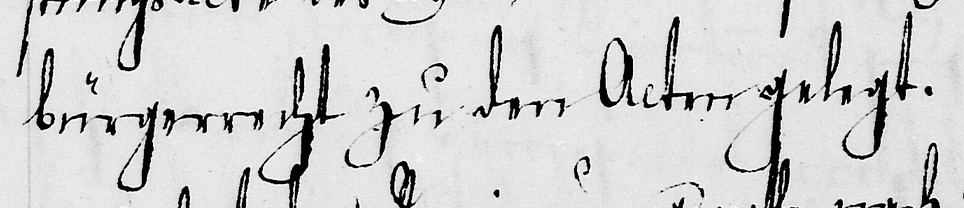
bürgerrecht zu den Acten gelegt.
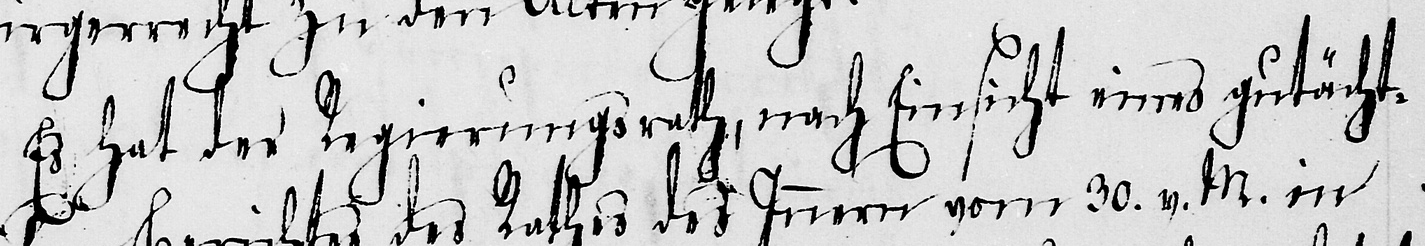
Es hat der Regierungsrath, nach Einsicht eines gutächt¬
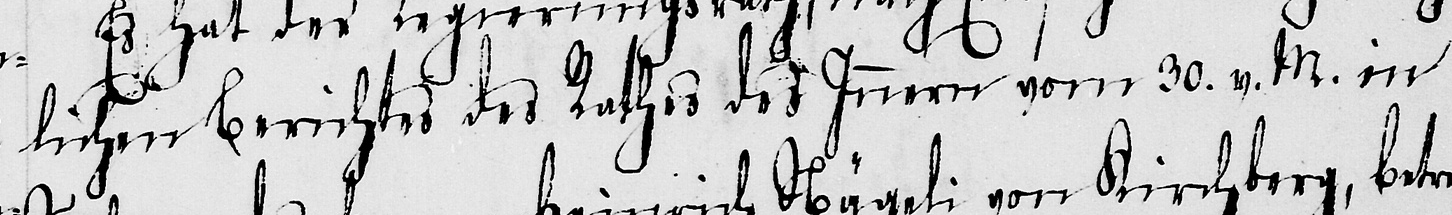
lichen Berichtes des Rathes des Innern vom 30. v. M. in
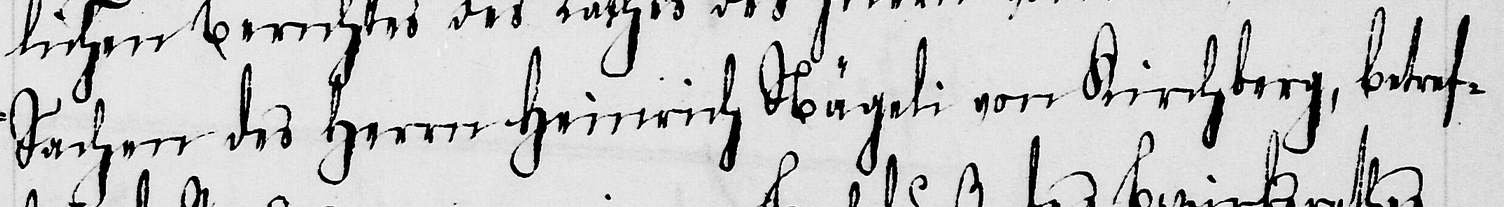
Sachen des Herrn Heinrich Nägeli von Kirchberg, betref¬
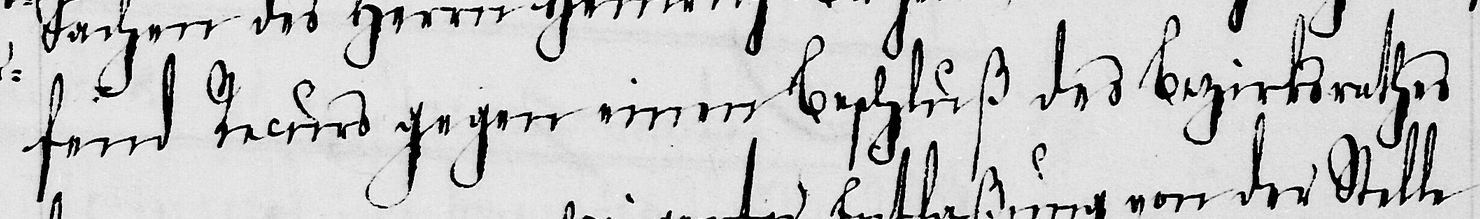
fend Recurs gegen einen Beschluß des Bezirksrathes
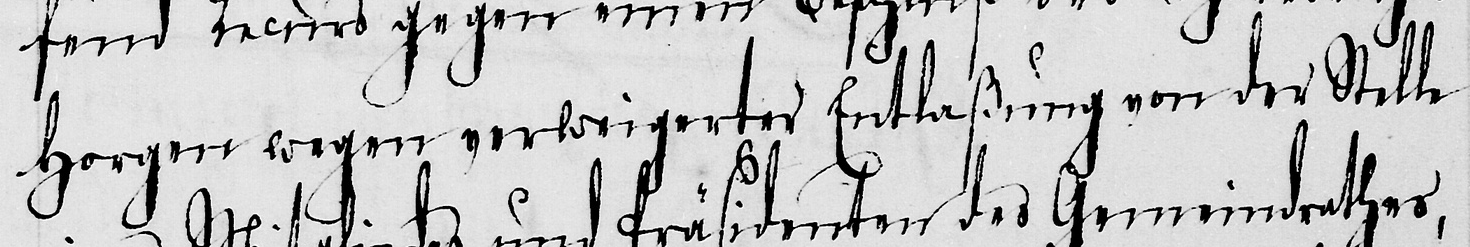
Horgen wegen verweigerter Entlaßung von der Stelle
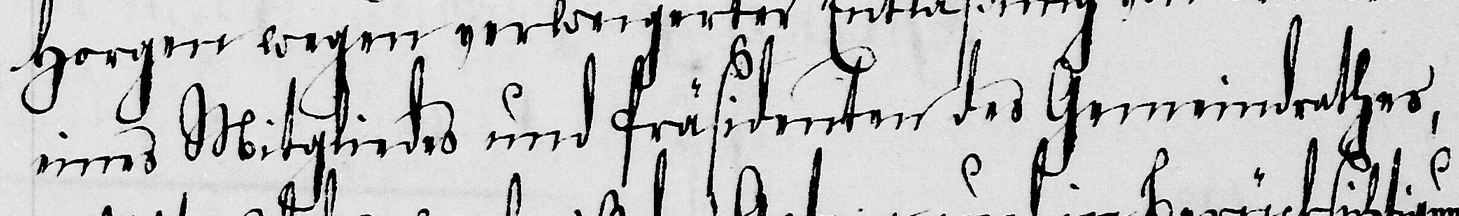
eines Mitgliedes und Präsidenten des Gemeindrathes,
